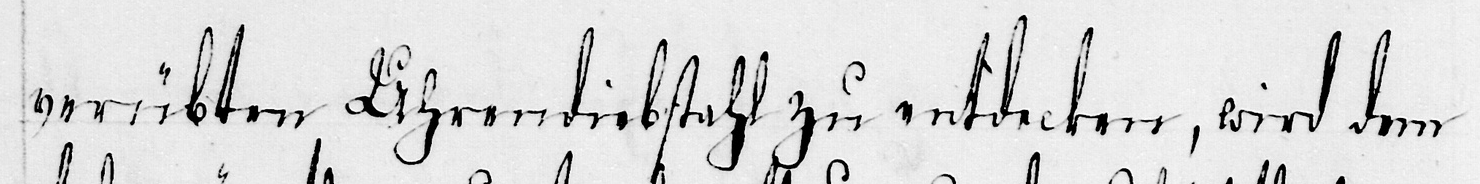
verübten Uhrendiebstahl zu entdecken, wird dem
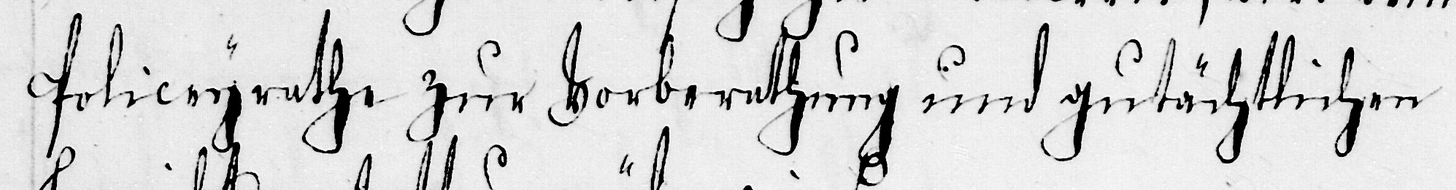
Policeyrathe zur Vorberathung und gutächtlichen
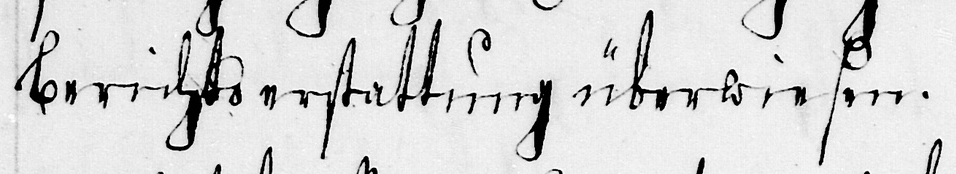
Berichtserstattung überwiesen.
